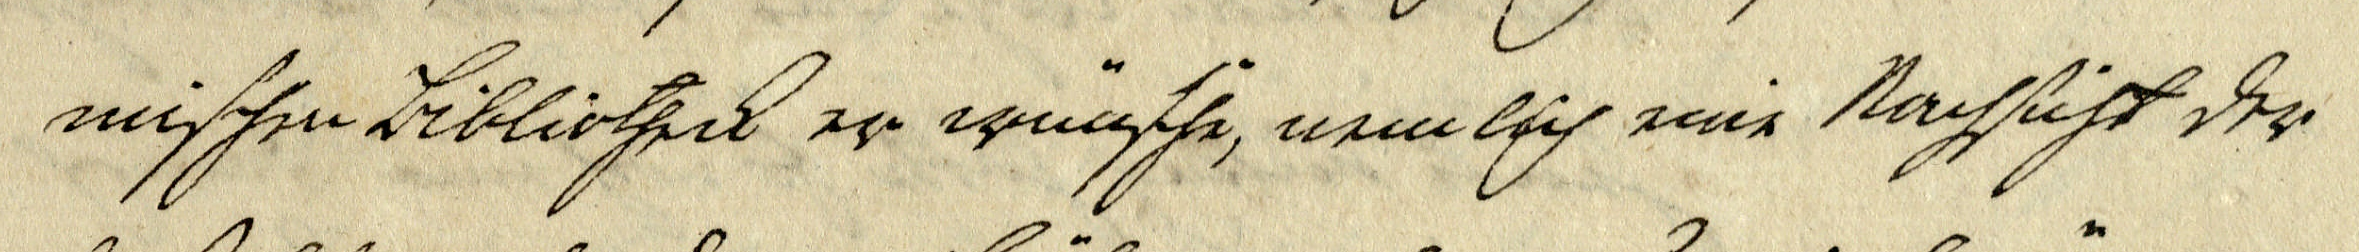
mischen Bibliotheck er wünsche, nemlich eine Nachsicht der
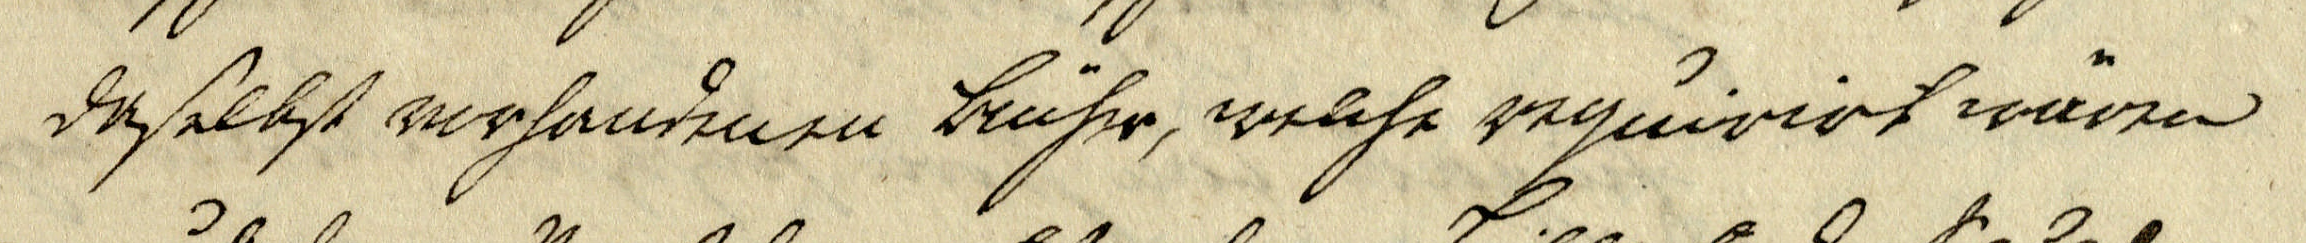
daselbst vorhandenen Bücher, welche requirirt wären
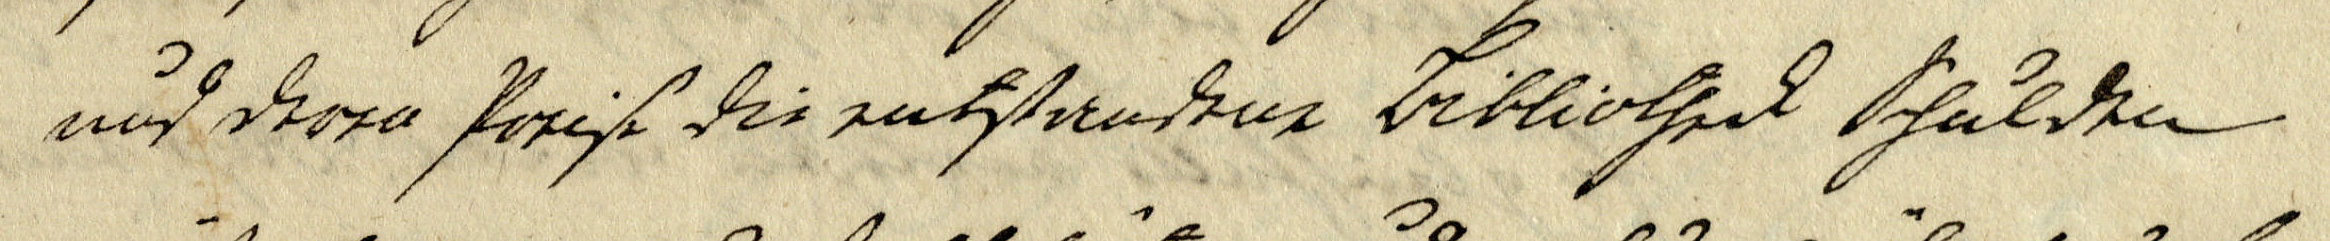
und deren Preise die entstandene Bibliothek Schulden
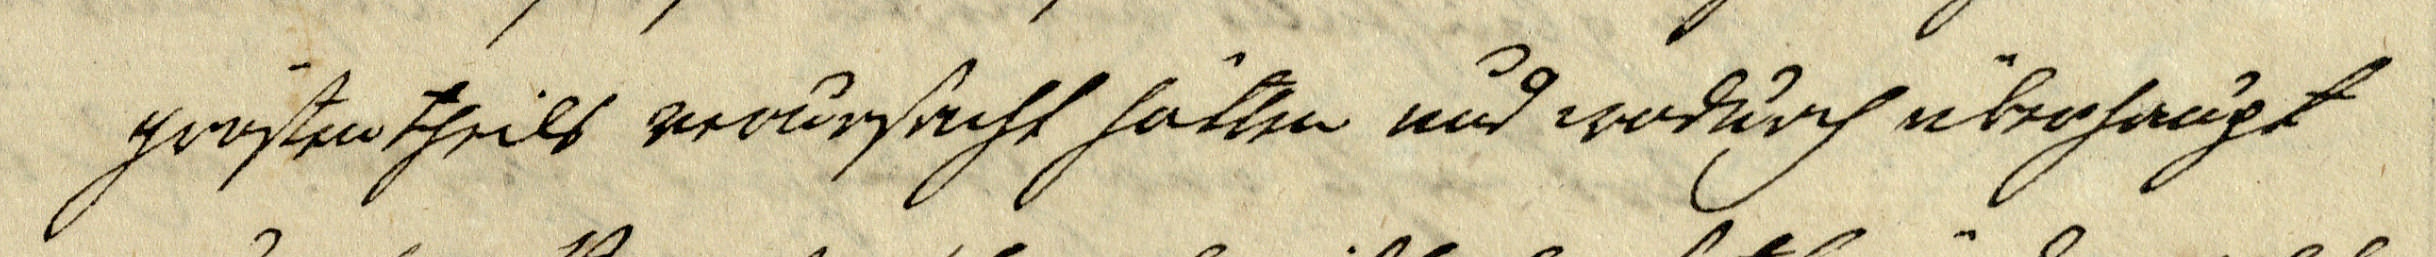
gröstentheils verursacht hätten und wodurch überhaupt
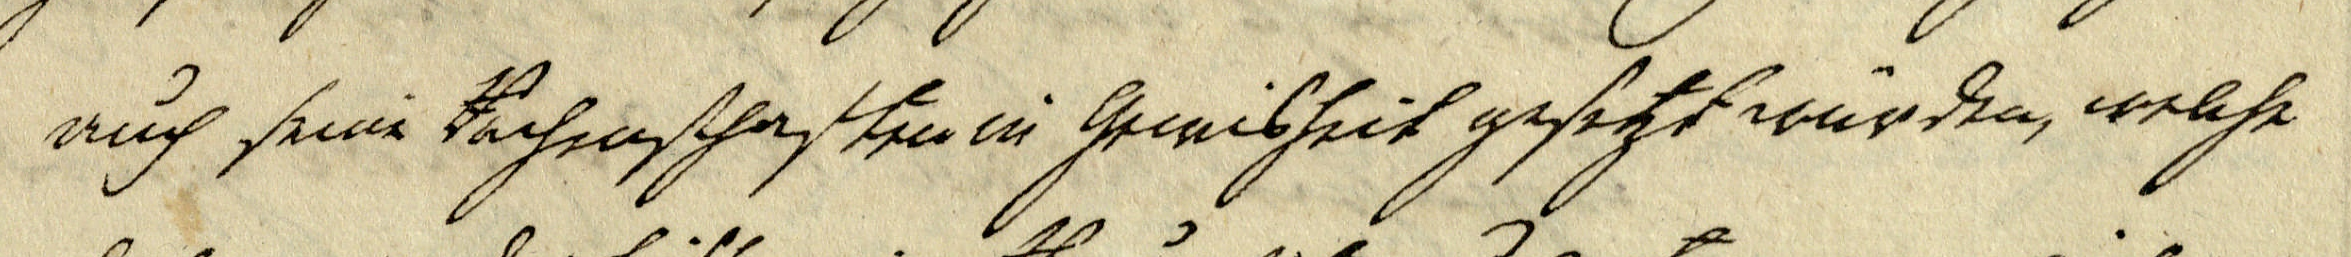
auch seine Rechenschaften in Gewisheit gesetzt würden, welche
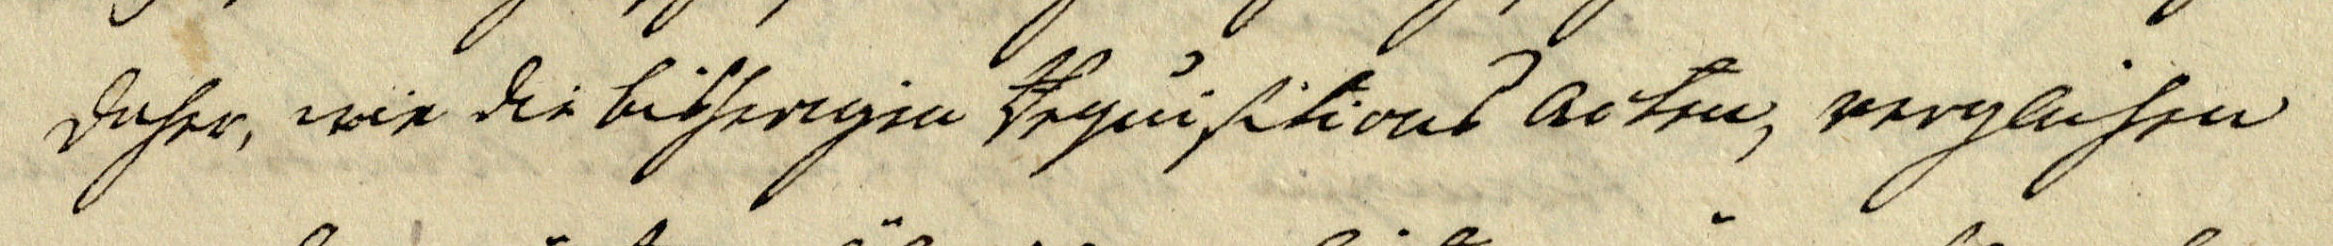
daher, wie die bisherigen Requisitions Acten, verglichen
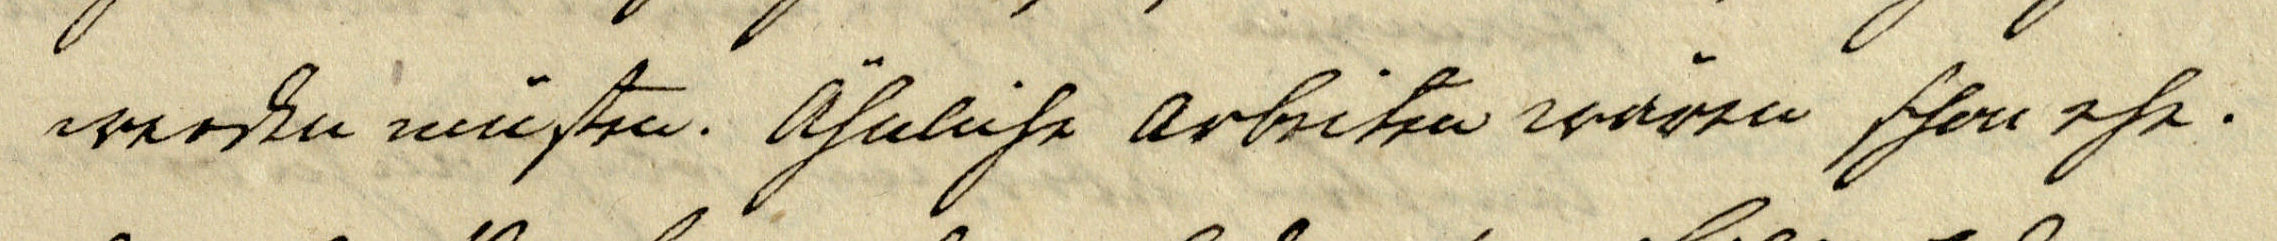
werden müsten. Ähnliche Arbeiten wären schon ehe¬
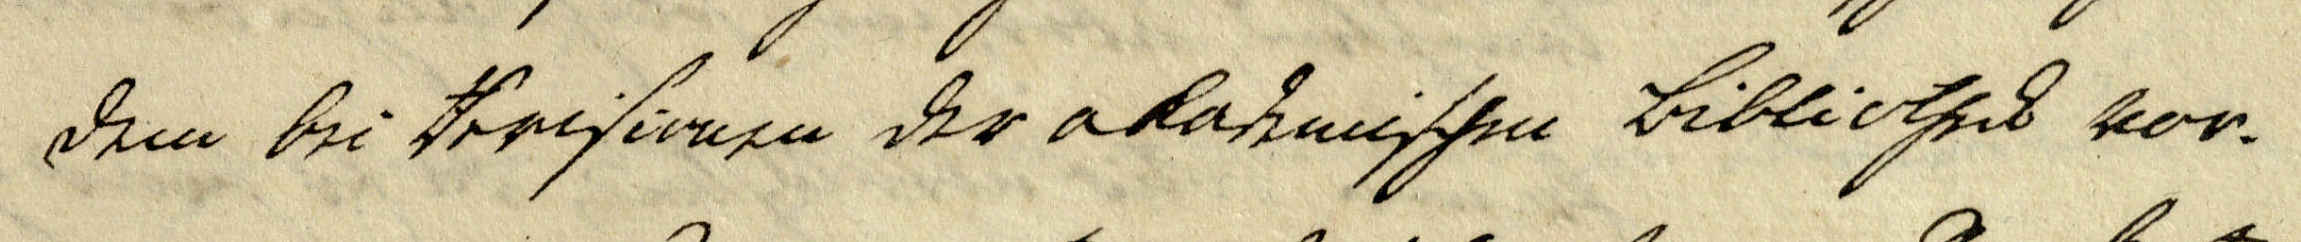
dem bei Revisionen der akademischen Bibliothek vor¬
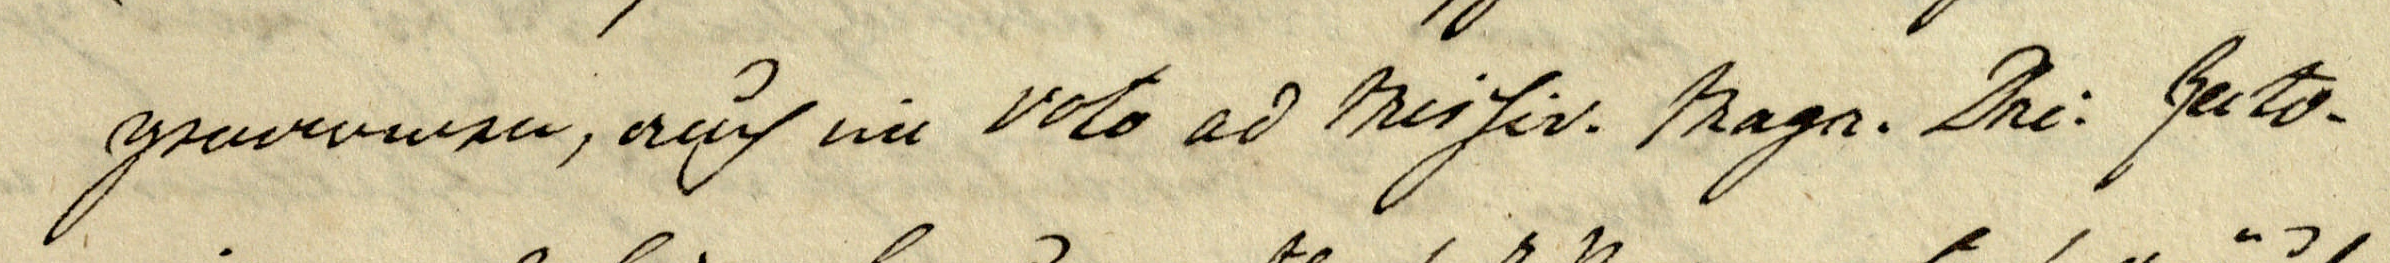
genommen, auch in voto ad Missiv. Magn. Dni. Recto¬
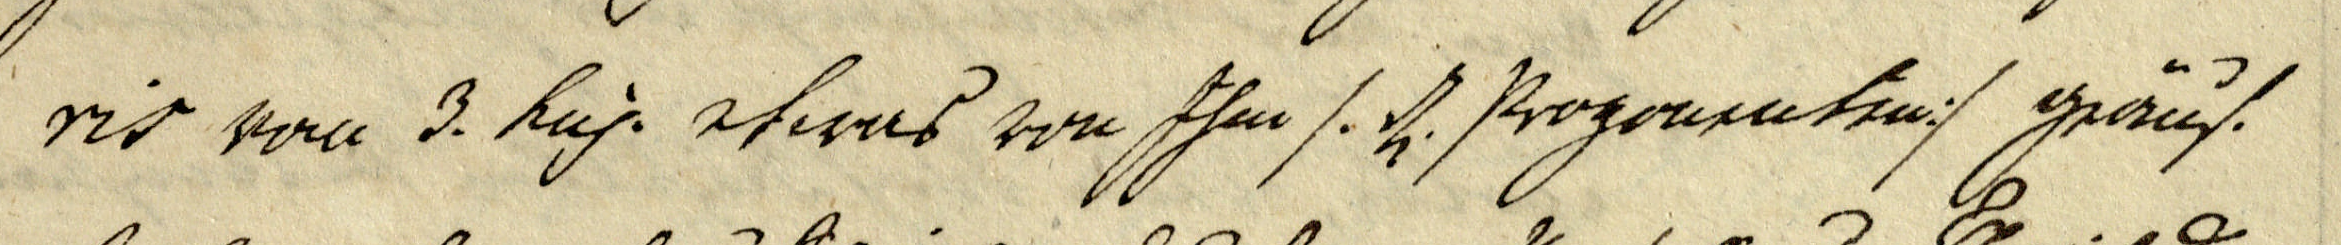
ris von 3. huj. etwas von Ihm /. dh. Proponenten:/ geäus¬
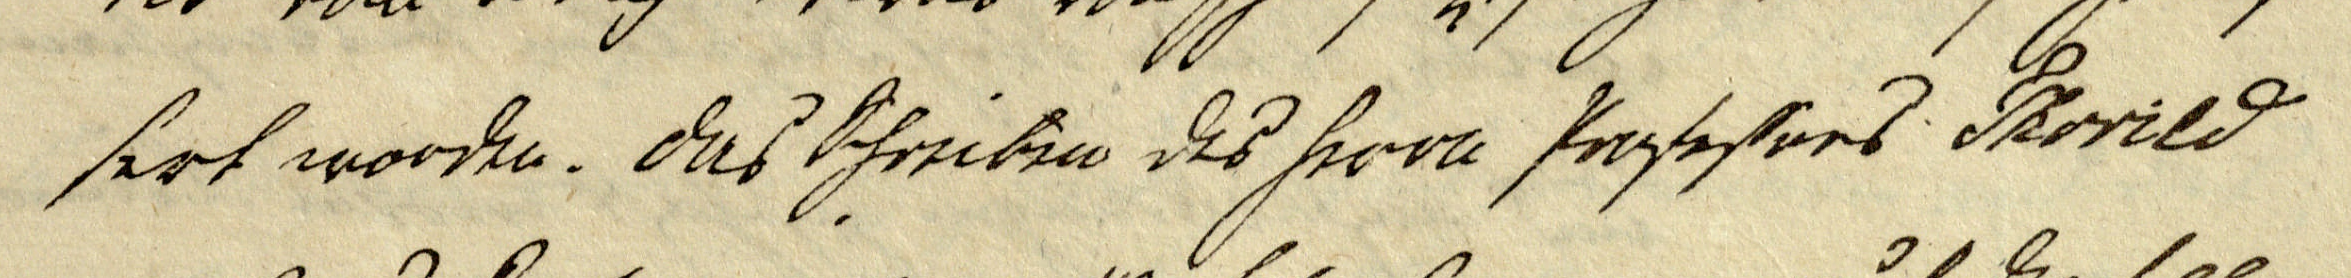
sert worden. Das Schreiben des Herrn Professors Thorild
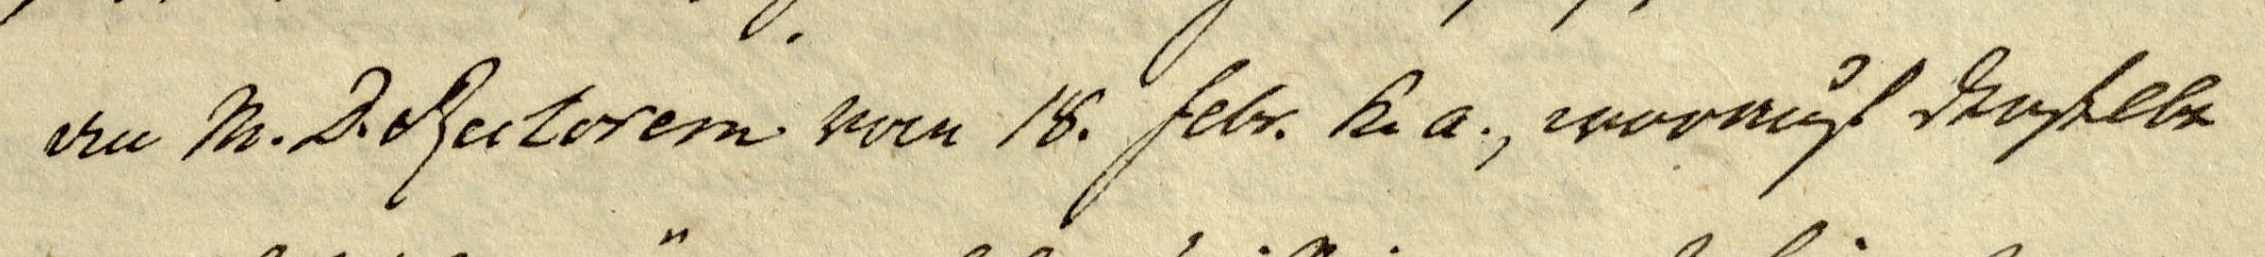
an M. D. Rectorem von 18. Febr. h. a., worauf derselbe
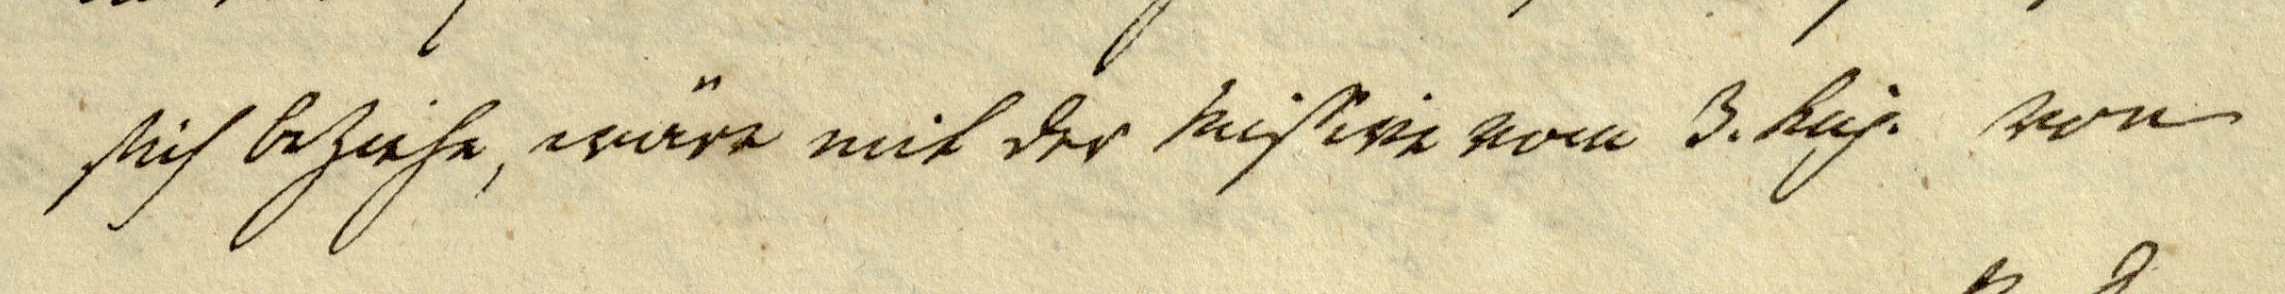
sich beziehe, wäre mit der Missive vom 3. huj. von
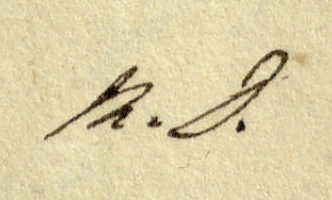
M. D.
